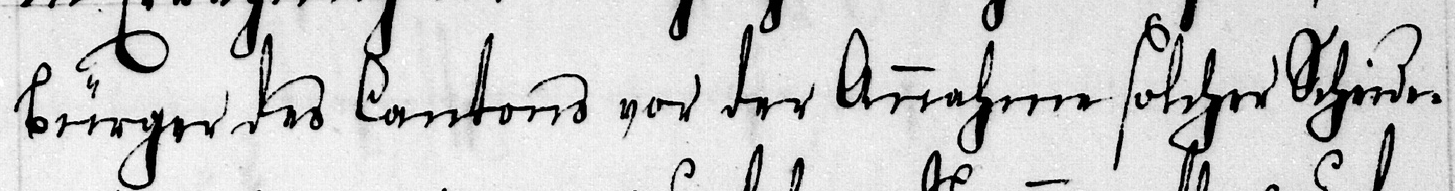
Bürger des Cantons vor der Annahme solcher Scheide¬
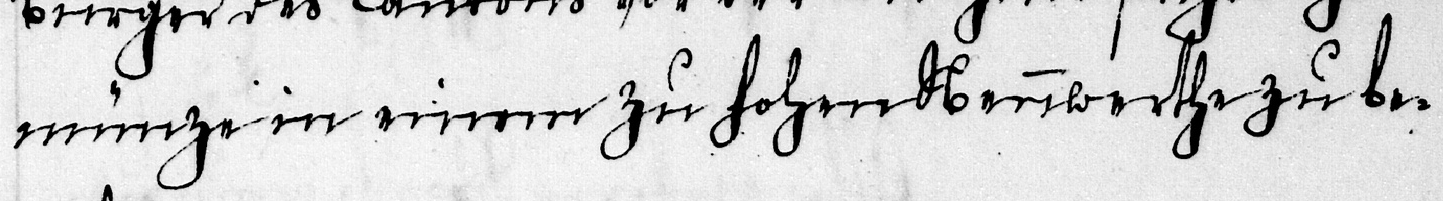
münze in einem zu hohen Nennwerthe zu be¬
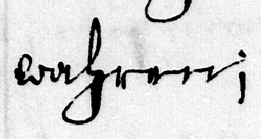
wahren;
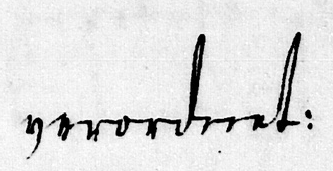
verordnet:
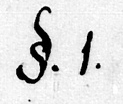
§. 2.
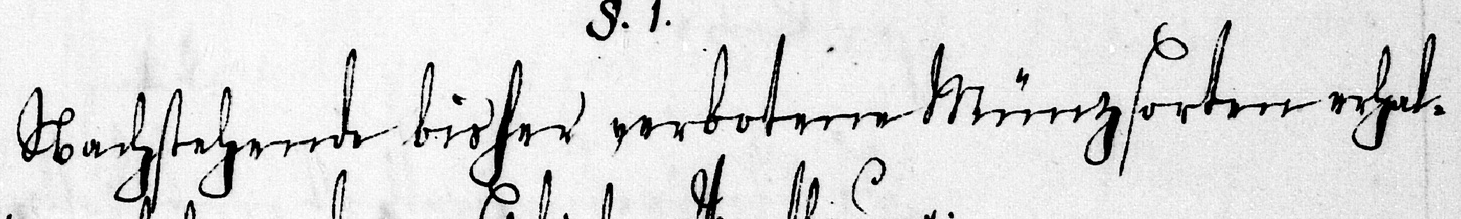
Nachstehende bisher verbotene Münzsorten erhal¬
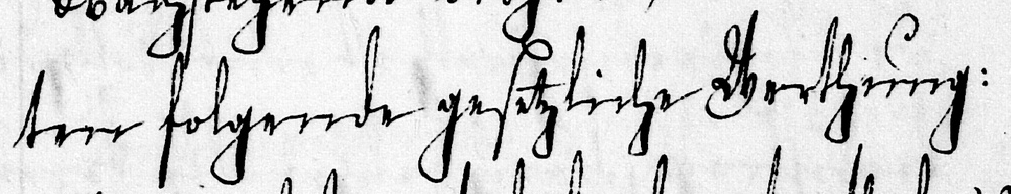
ten folgende gesetzliche Werthung:
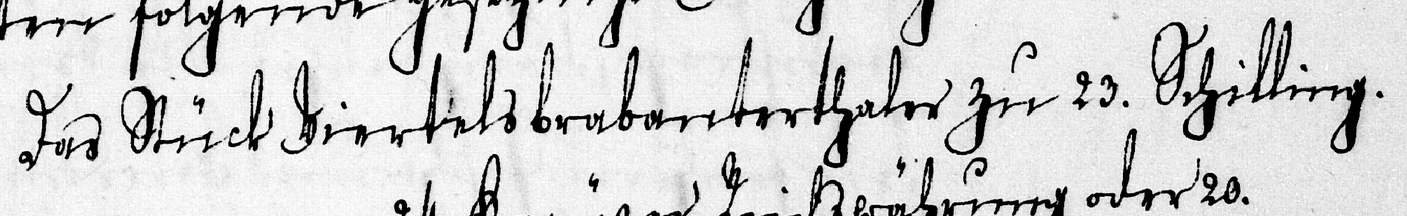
Das Stück Viertelsbrabanterthaler zu 23. Schilling.
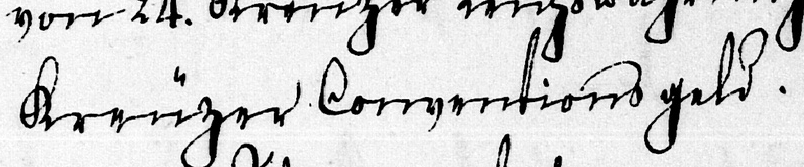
Kreuzer Conventionsgel¬
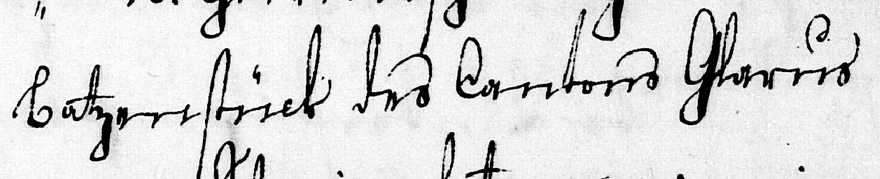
Batzenstück des Cantons Glaru¬
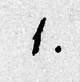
1.
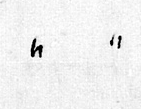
2.
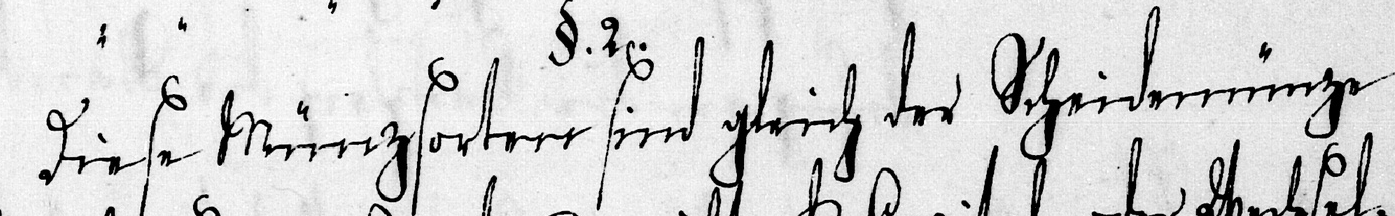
Diese Münzsorten sind gleich der Scheidemünze
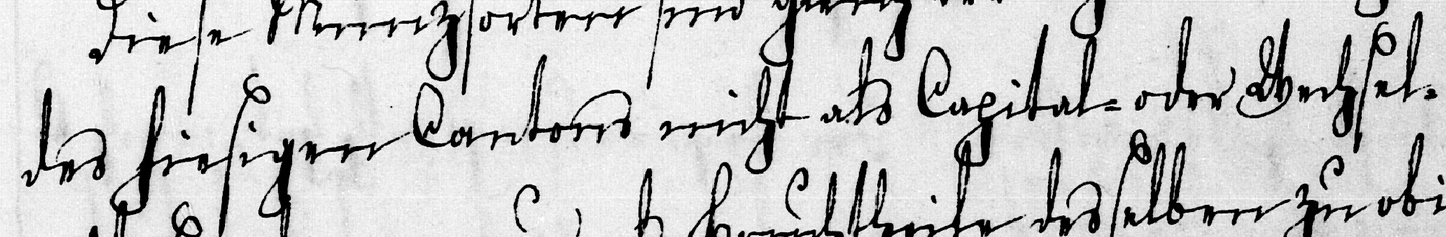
des hiesigen Cantons nicht als Capital- oder Wechsel¬
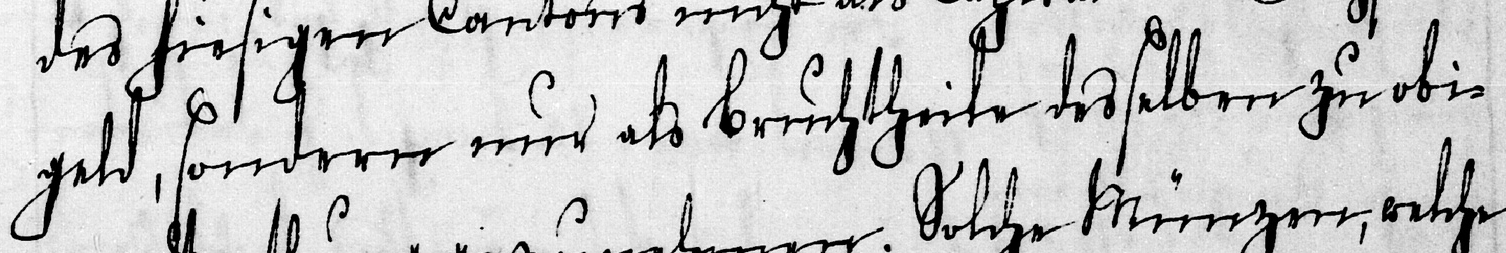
geld, sondern nur als Bruchtheile desselben zu obi¬
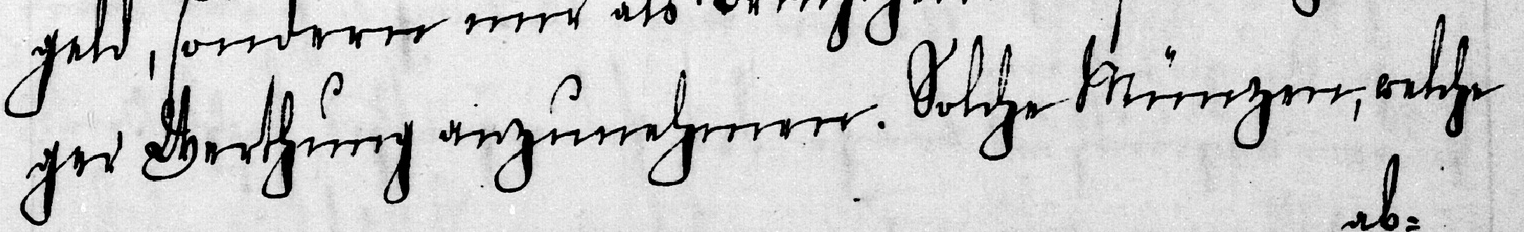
ger Werthung anzunehmen. Solche Münzen, welche
